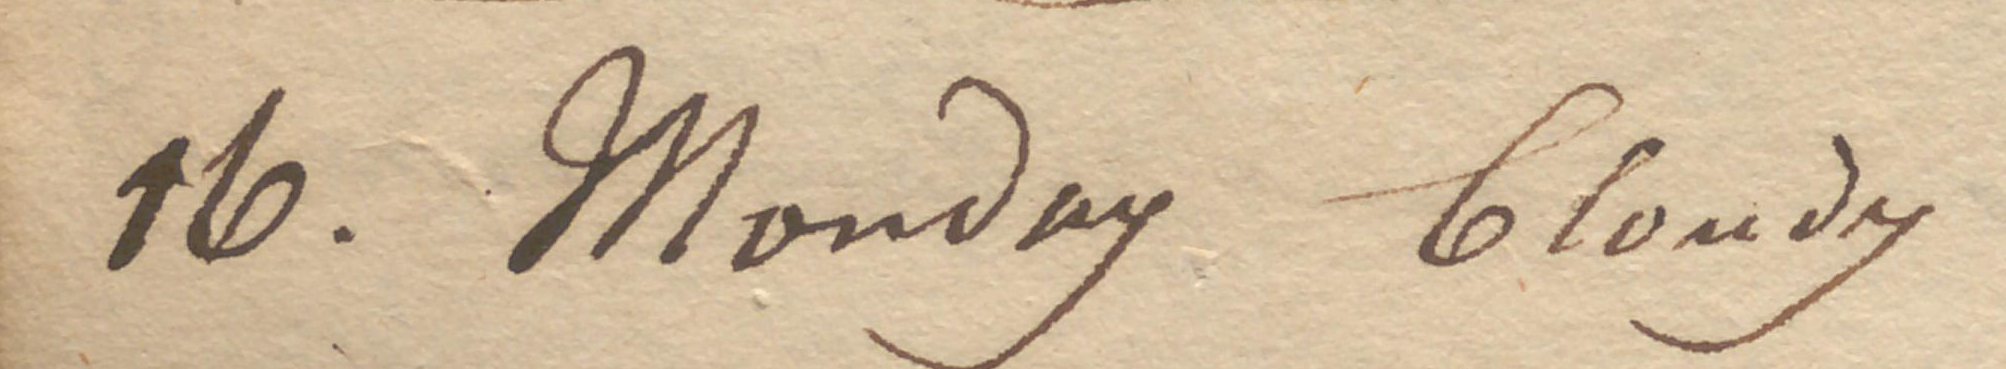16. Monday Cloudy
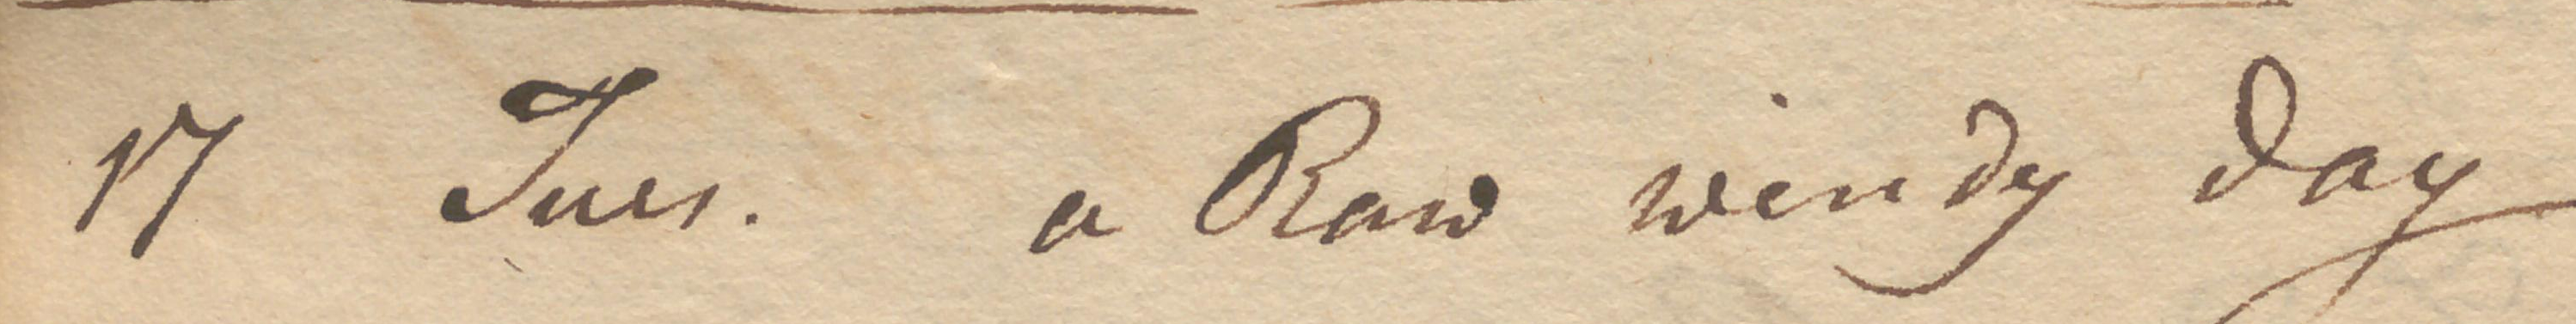17 Tues. a Raw windy day
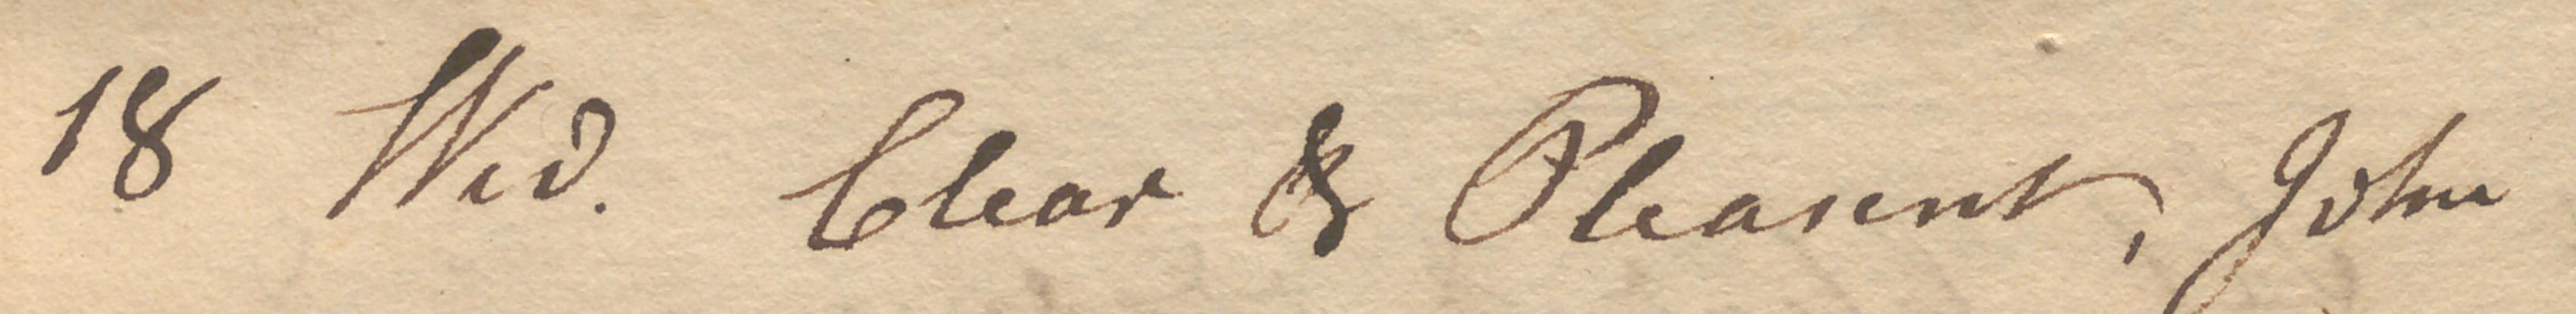18 Wed. Clear & Pleasent, John
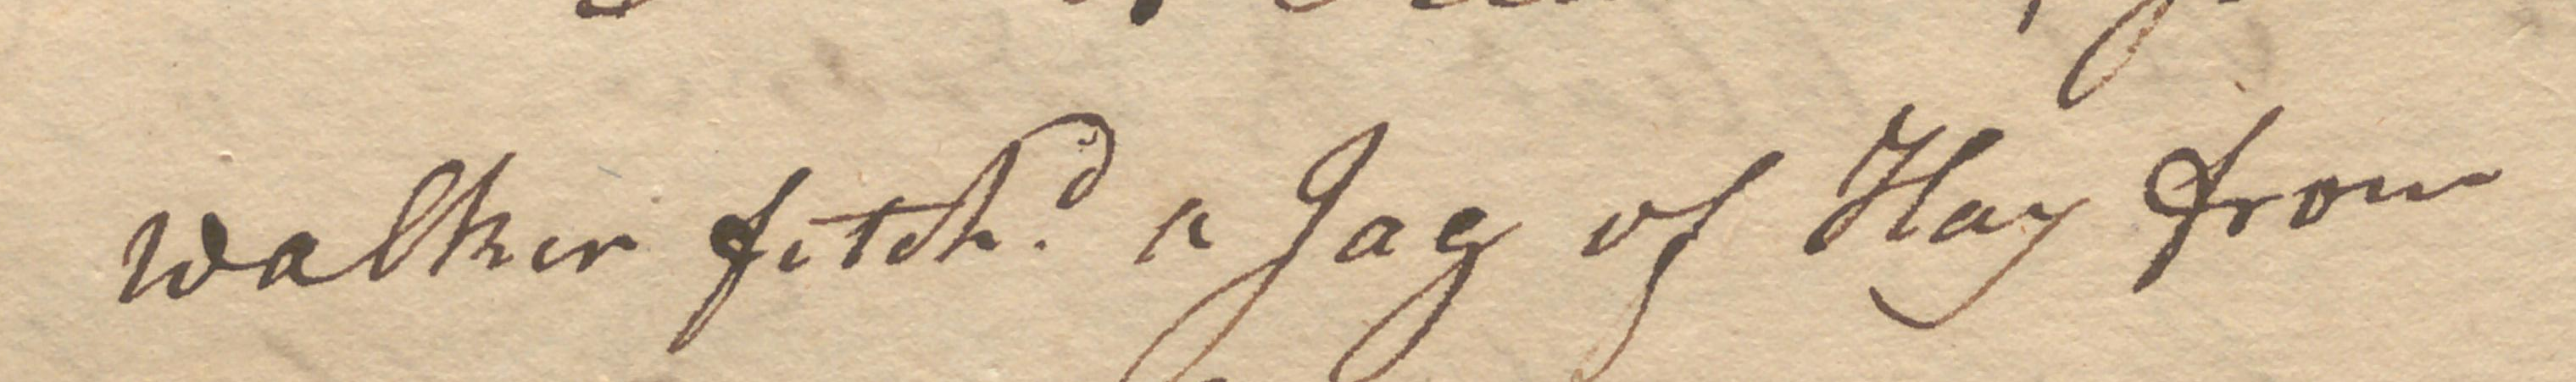walker fetch^d. a Jag of Hay from
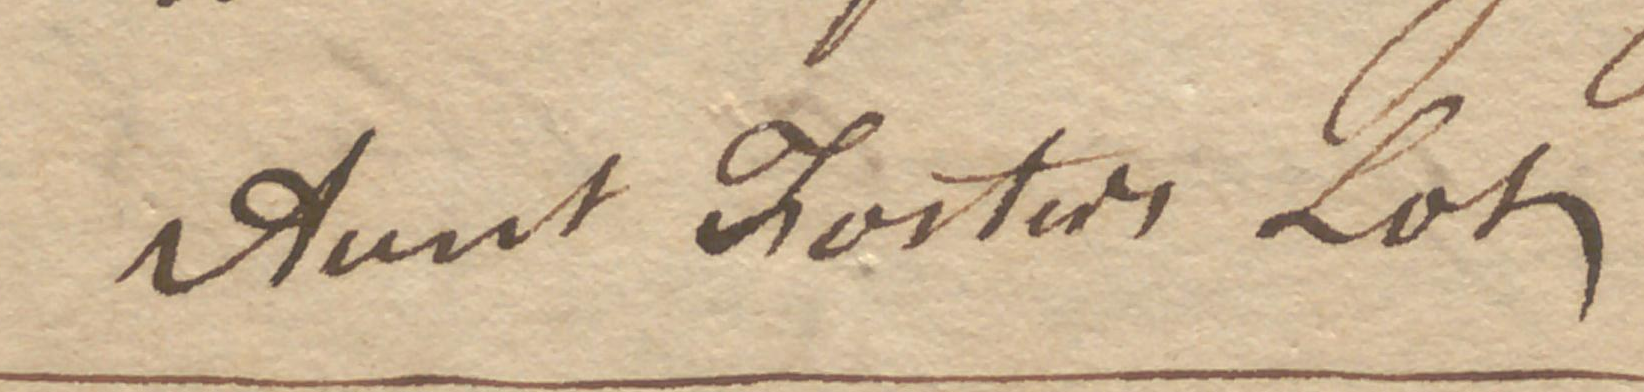Aunt Fosters Lot
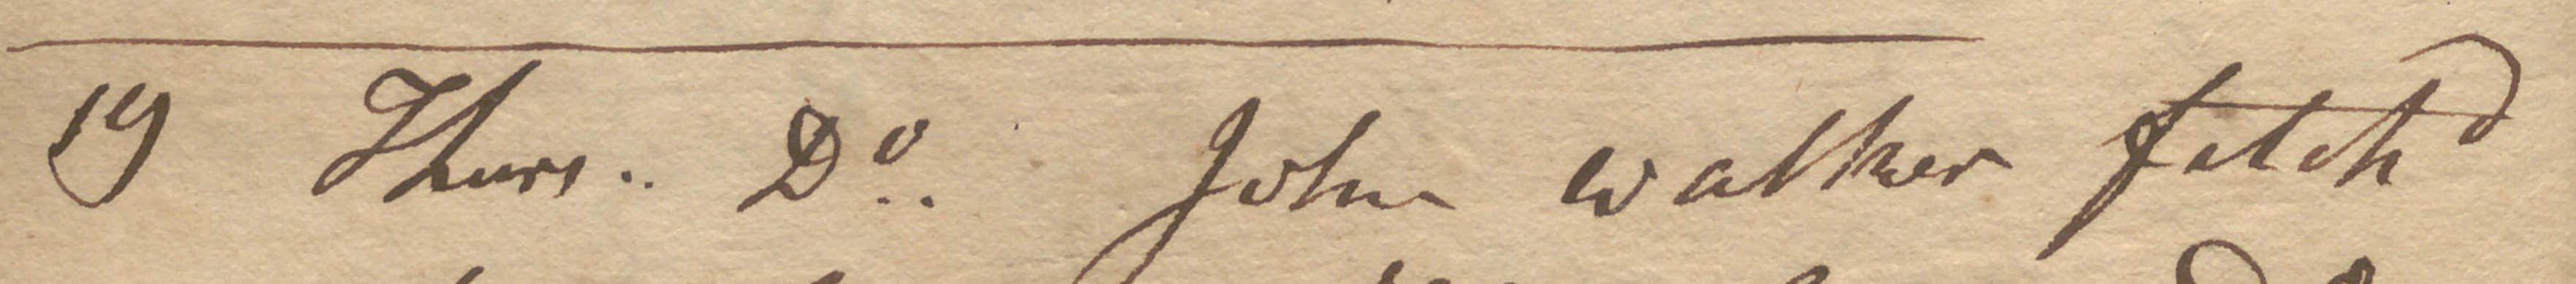19 Thurs. D^o.. John walker fetch^d
